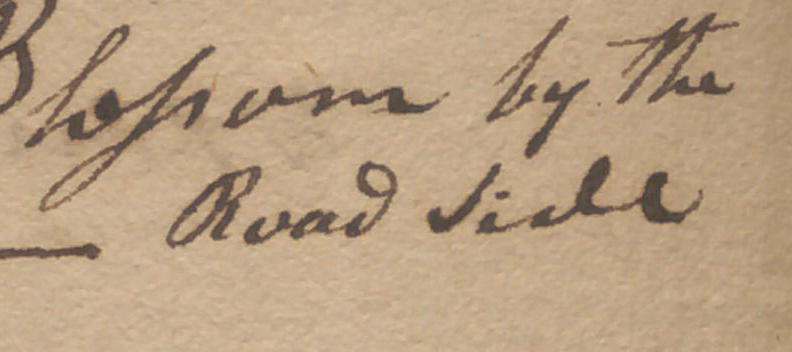Road Side
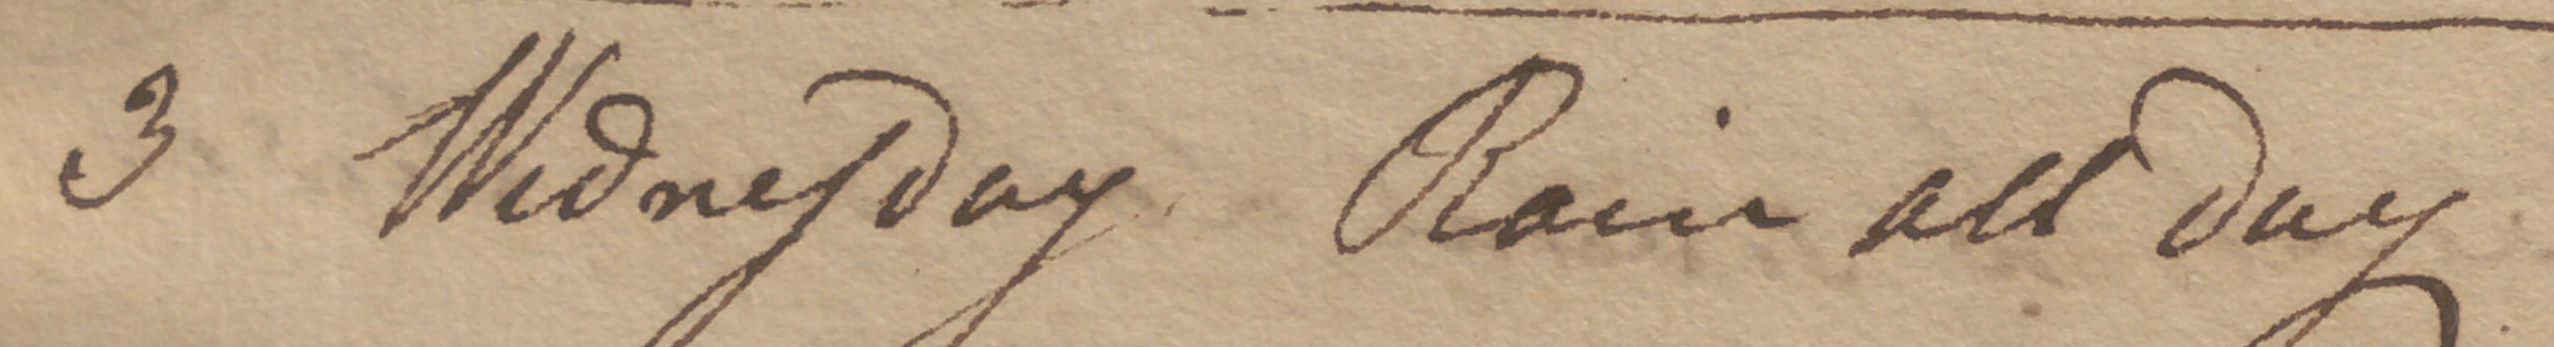3 Wednesday Rain all day
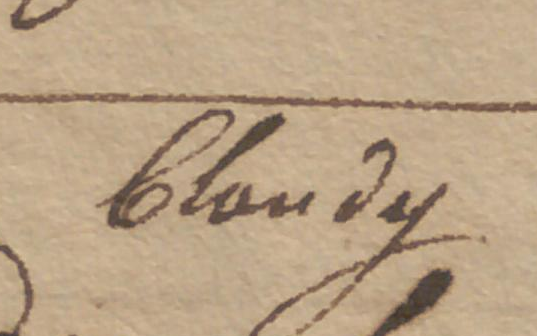Cloudy
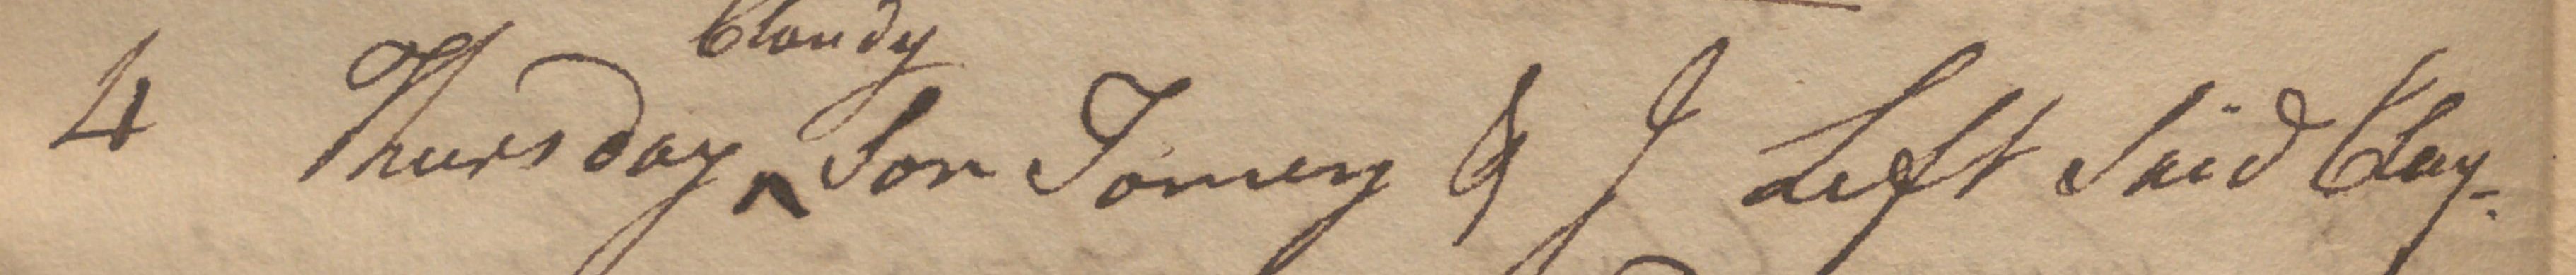4 Thursday ^ Son Tomey & I Left Said Clay-
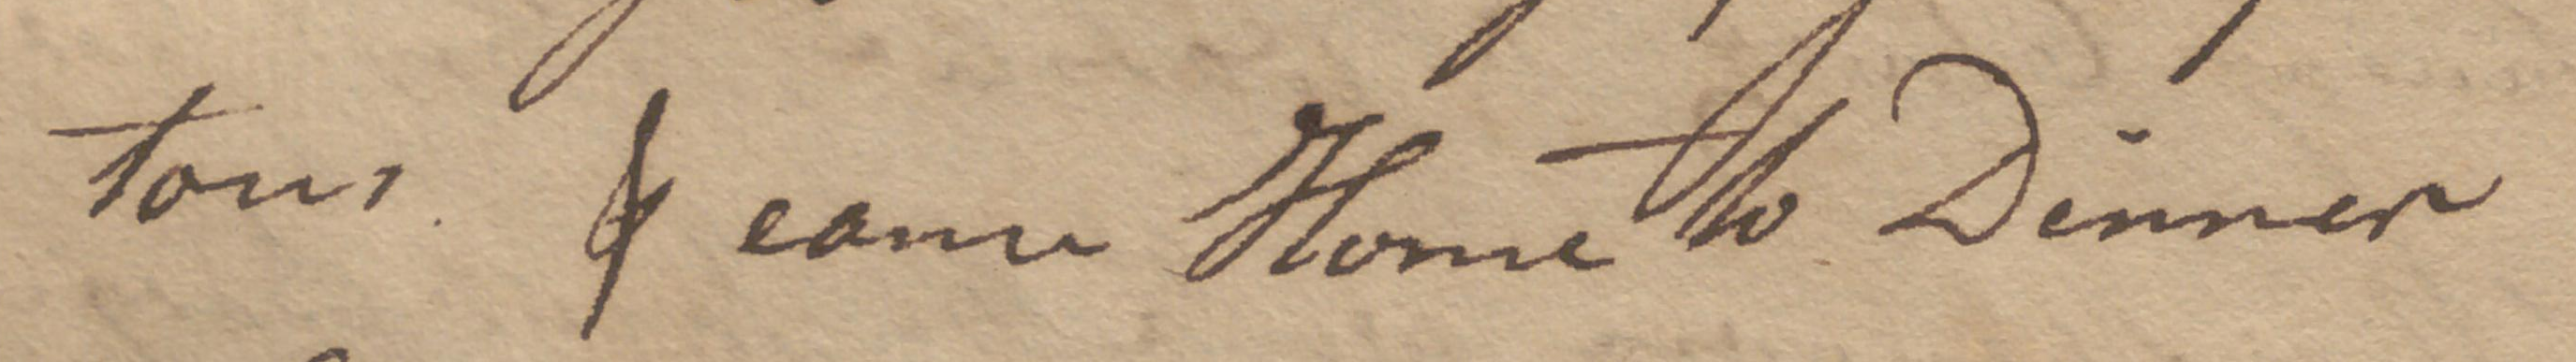tons & came Home to Dinner
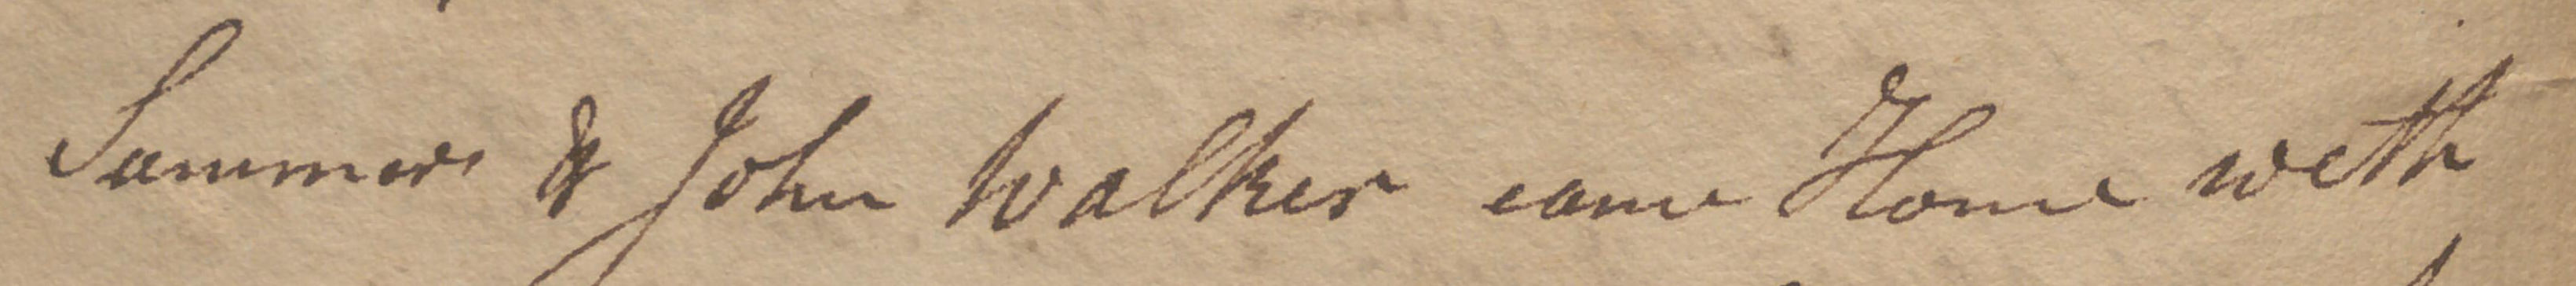Summers & John Walker came Home with
